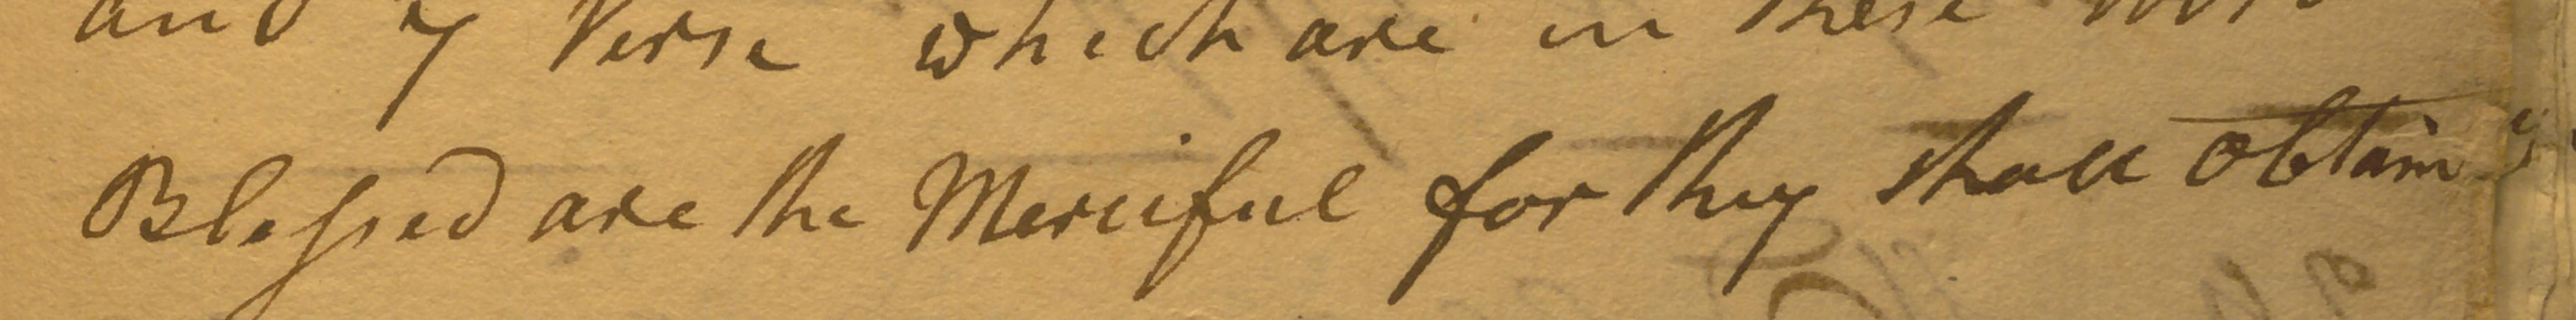Blessed are the Merciful for they shall obtain
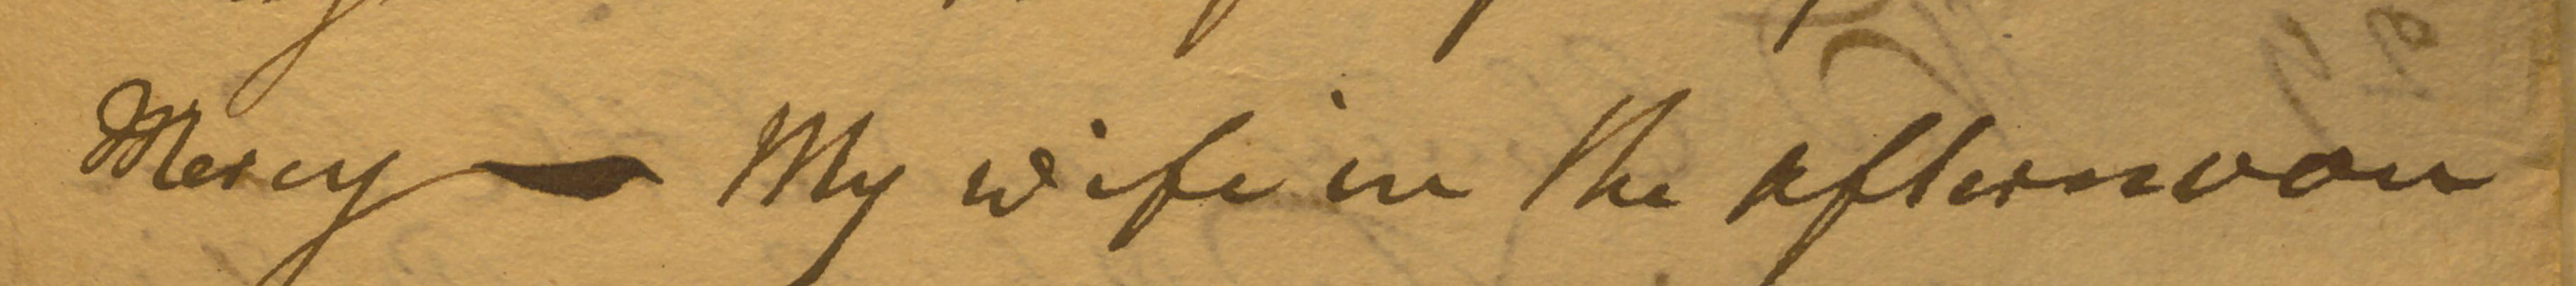Mercy- My wife in the afternoon
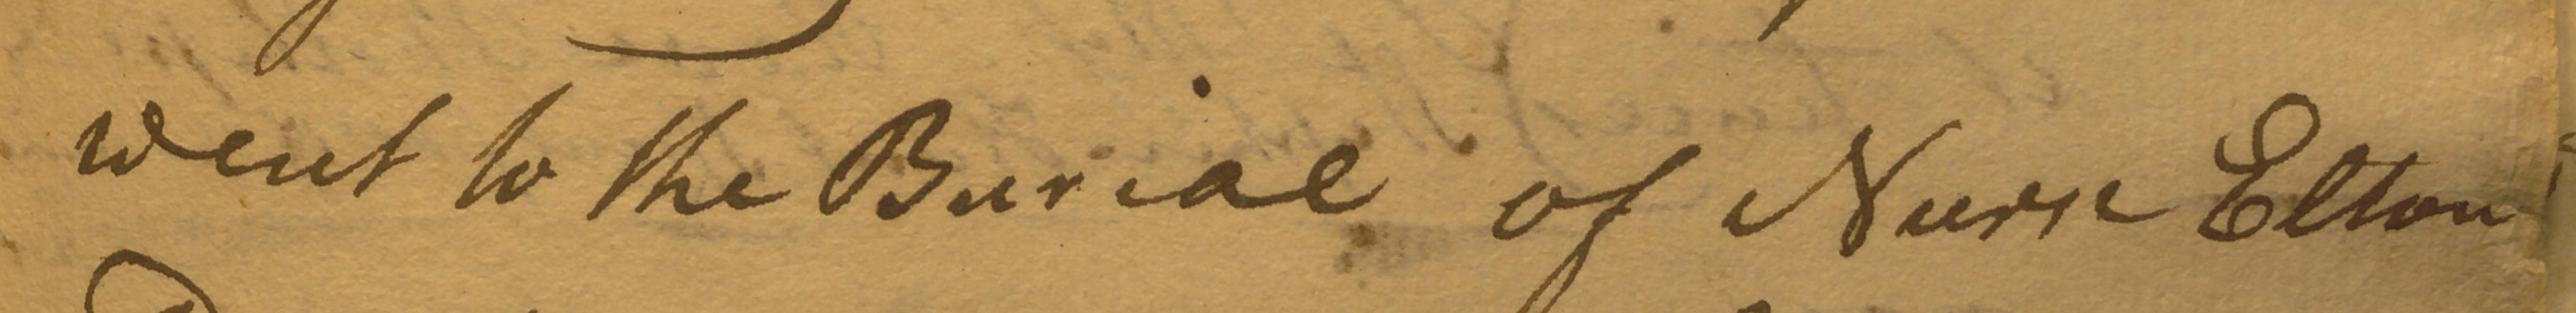went to the Burial of Nurse Elton
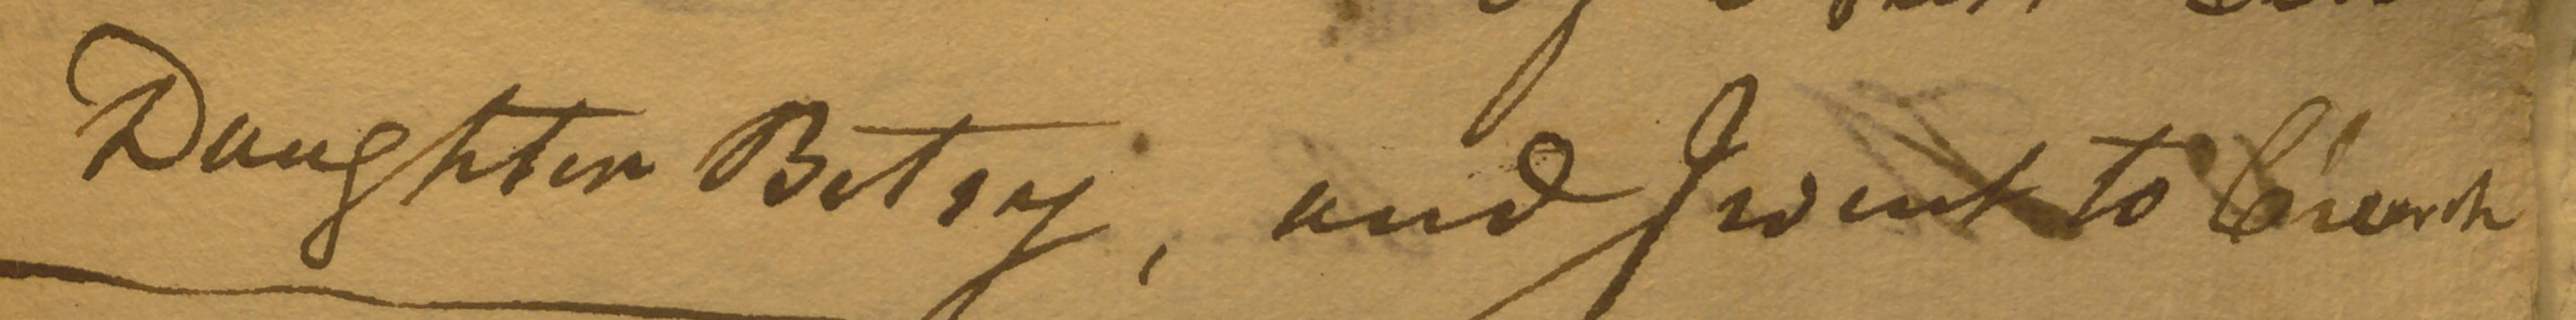Daughter Betsey and I went to Church
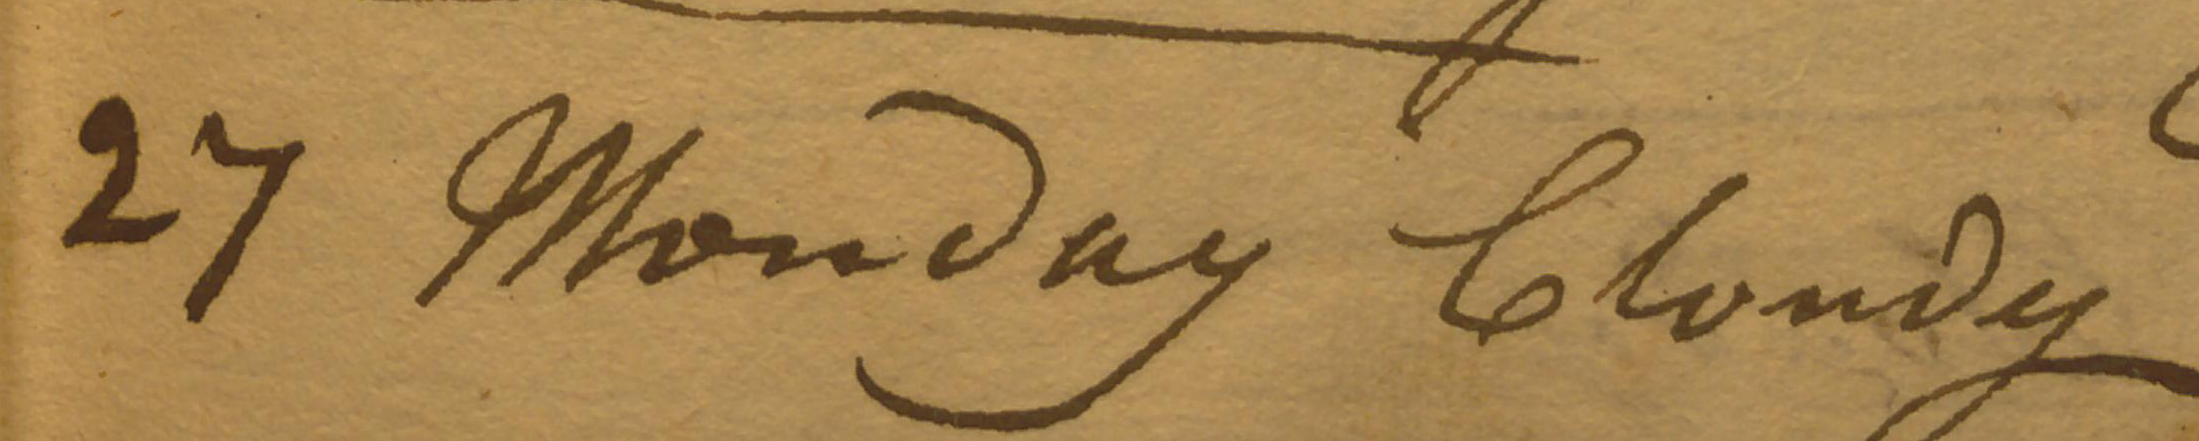27 Monday Cloudy
